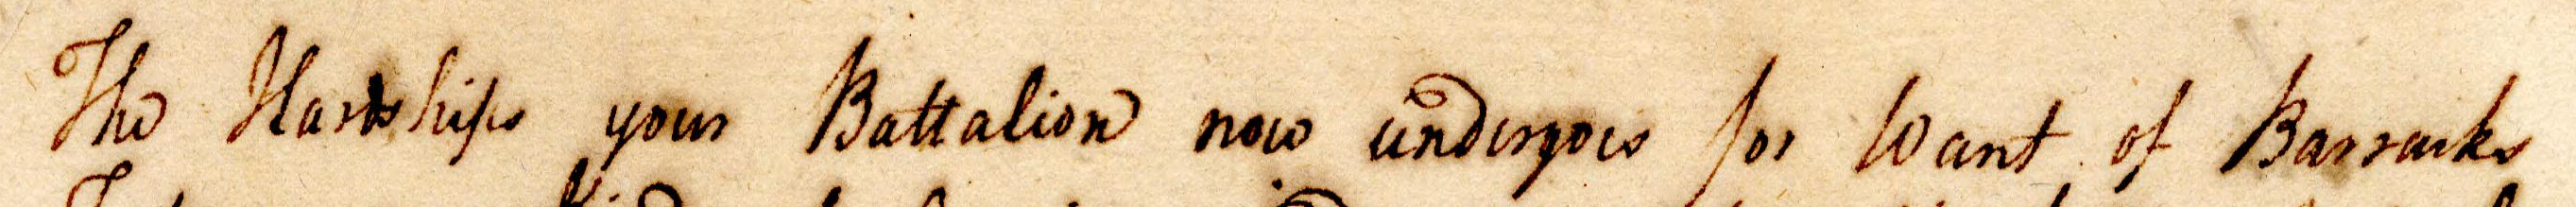The Hardships your Battalion now undergoes for Want of Barracks
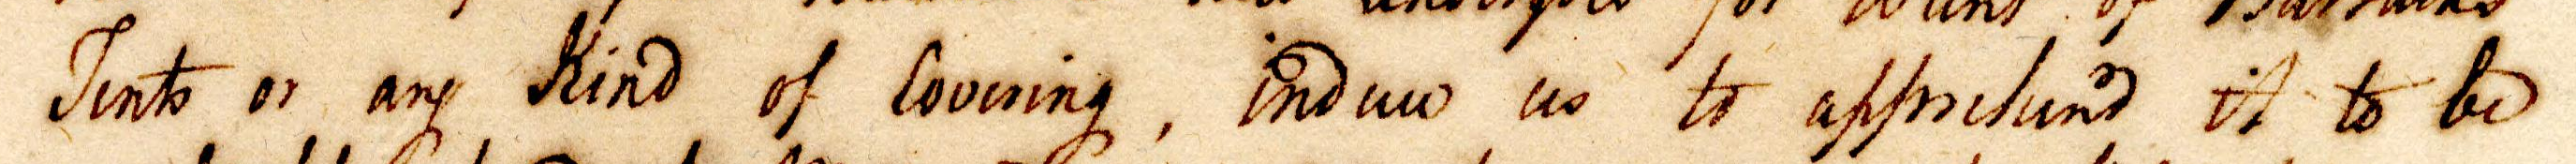Tents or any Kind of Covering, induce us to apprehend it to be
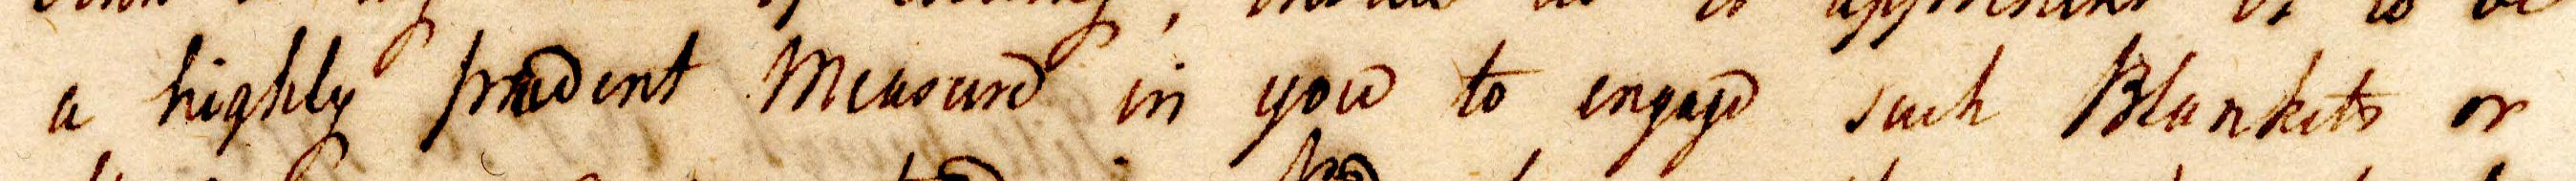a highly prudent Measure in you to engage such Blankets or
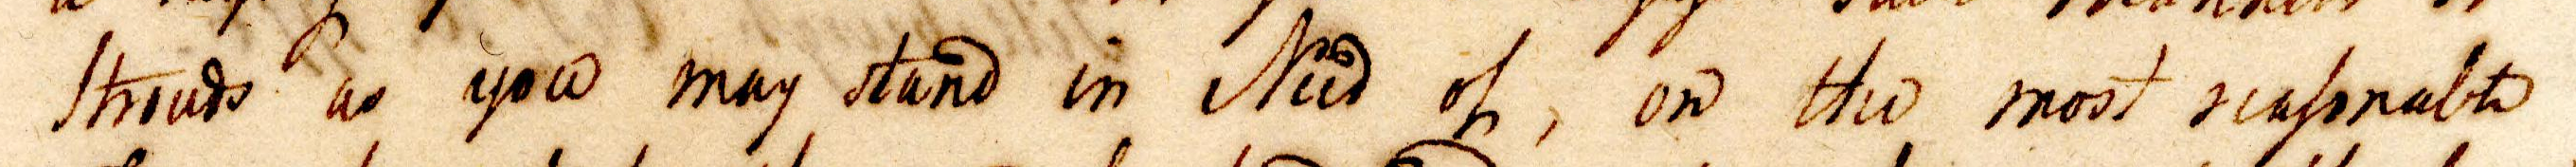Strouds as you may stand in Need of, on the most reasonable
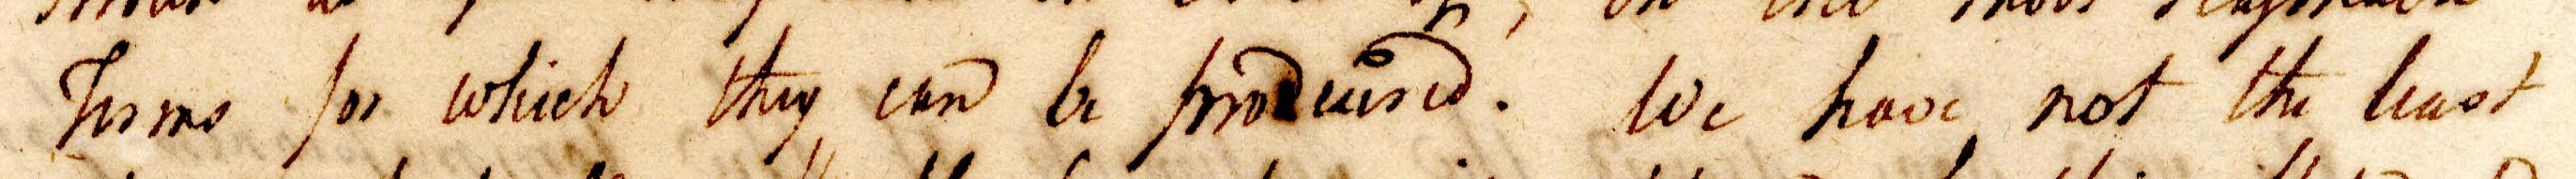Terms for which they can be produced. We have not the least
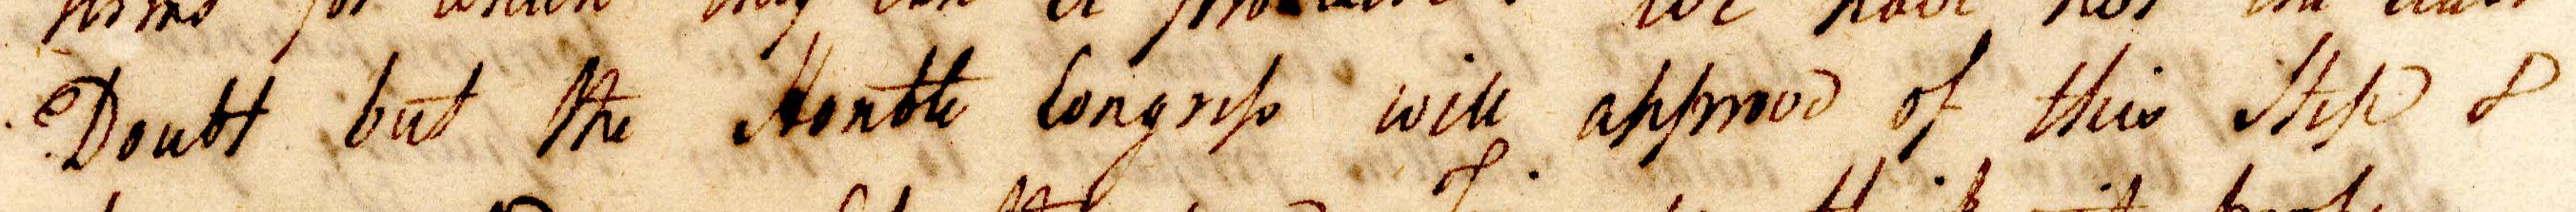Doubt but the Honble Congress will approve of this Step &
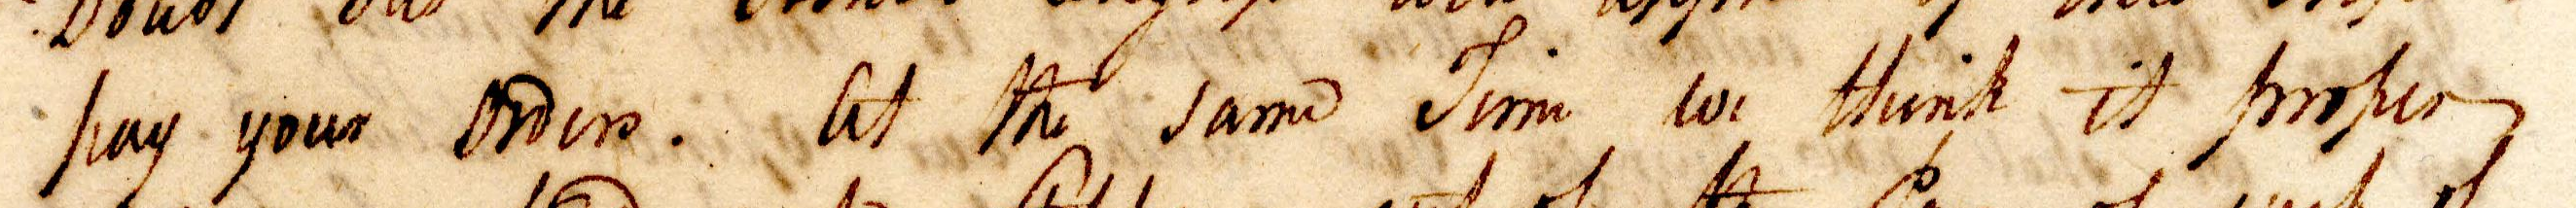pay your Orders. At the same Time we think it proper
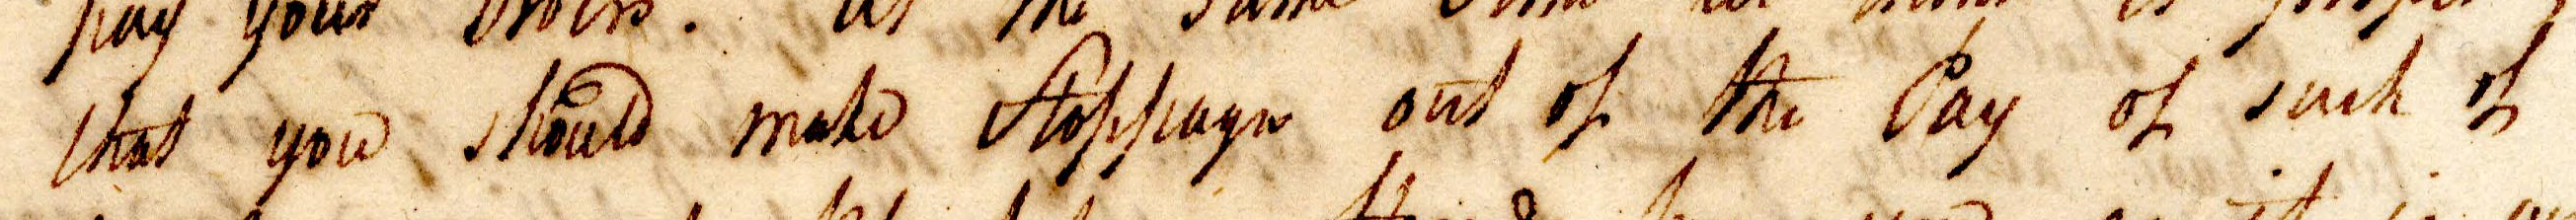that you should make Stoppage out of the Pay of such to
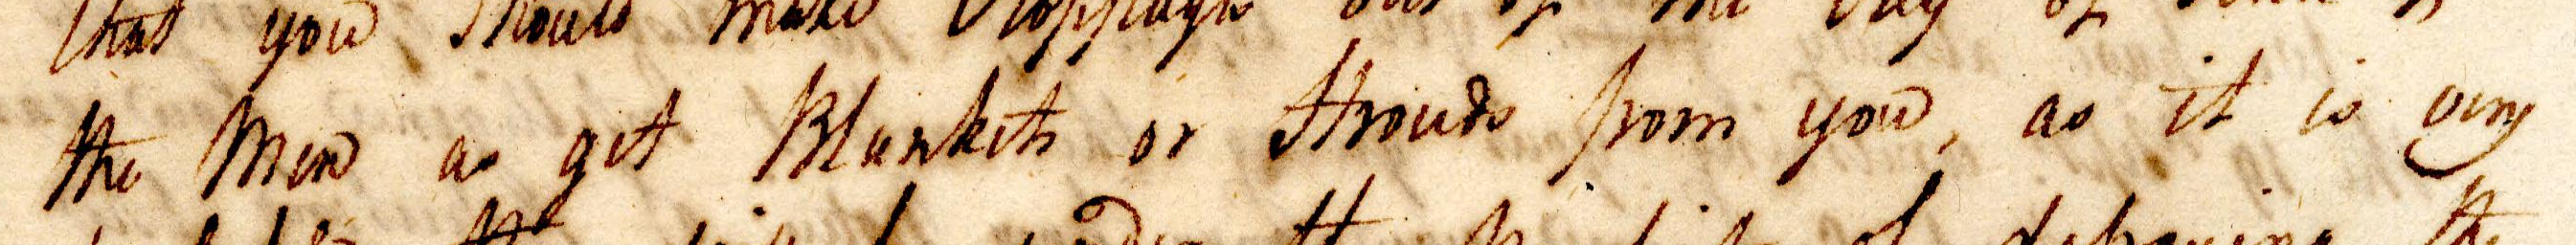the Men as get Blankets or Strouds from you, as it is very
